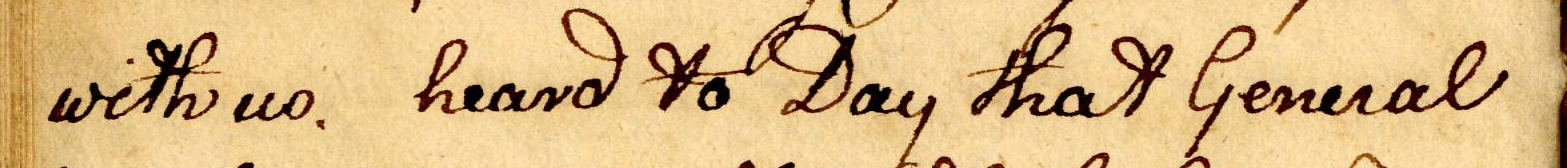with us. heard to Day that General
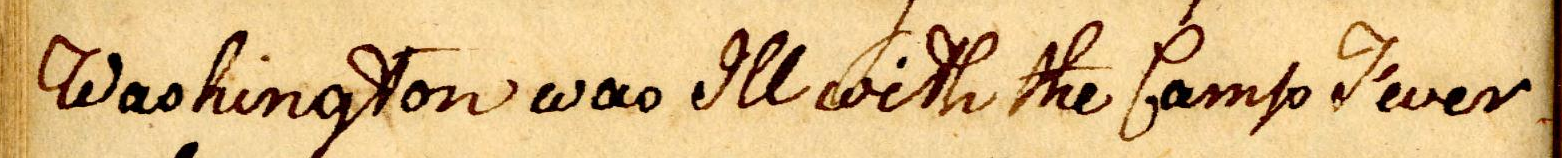Washington was Ill with the Camp Fever
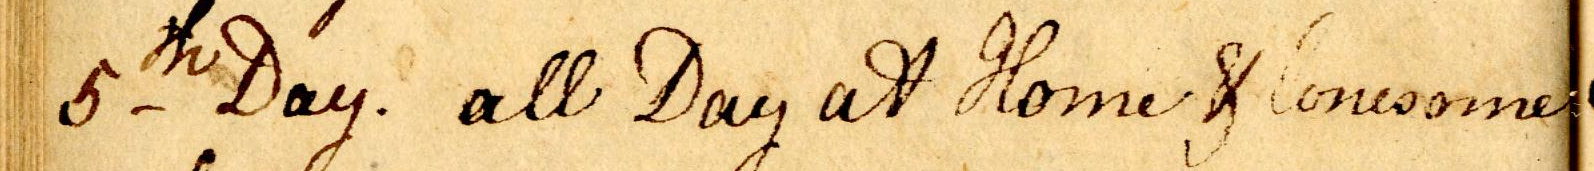5^th Day. all Day at Home & lonesome
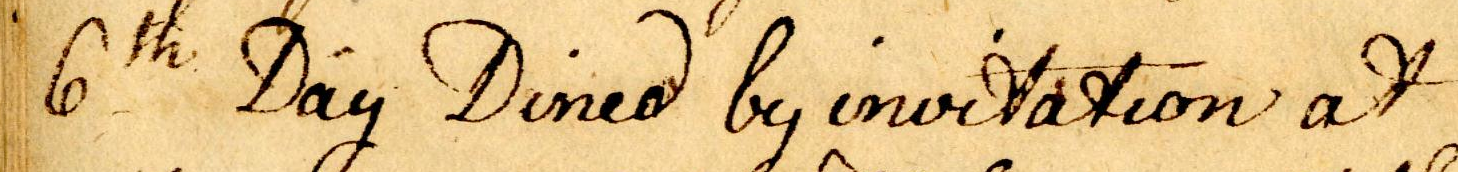6^th Day Dined by invitation at
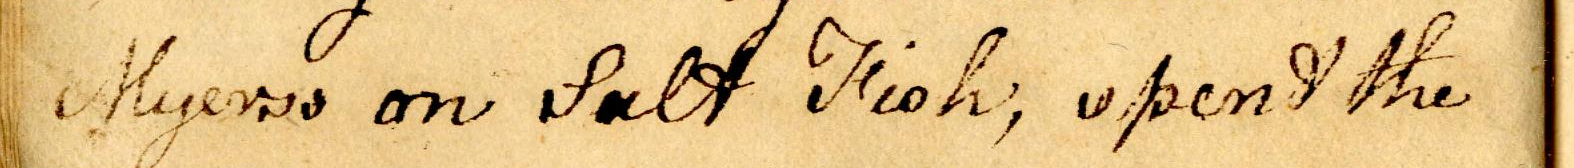Myerss on Salt Fish, spent the
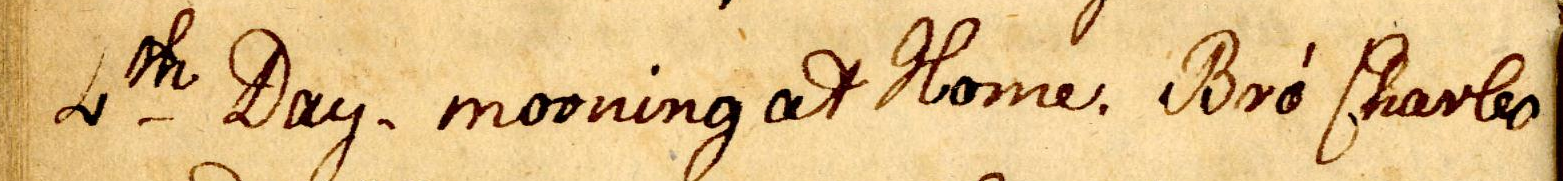4^th Day. morning at Home. Bro' Charles
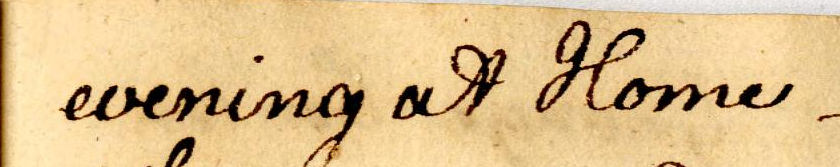evening at Home-
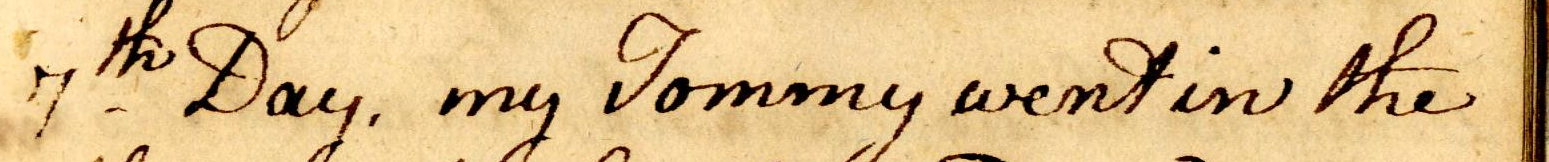7^th Day, my Tommy went in the
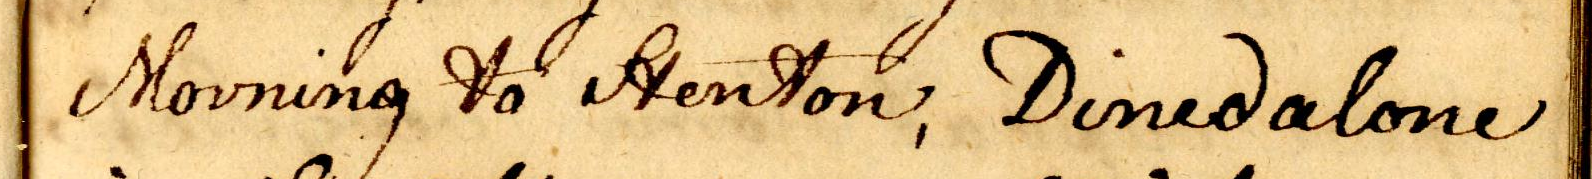Morning to Stenton, Dined alone
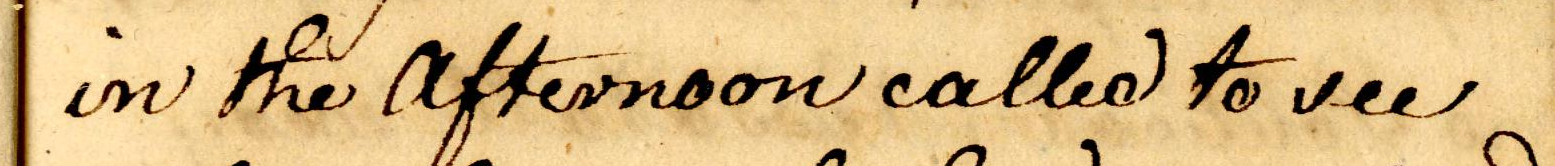in the Afternoon called to see
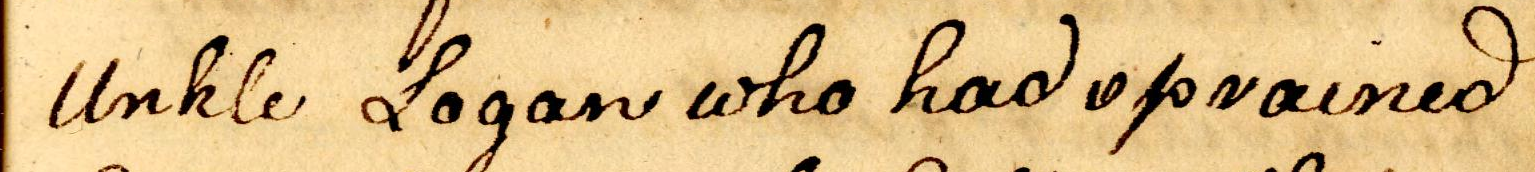Unkle Logan who had sprained
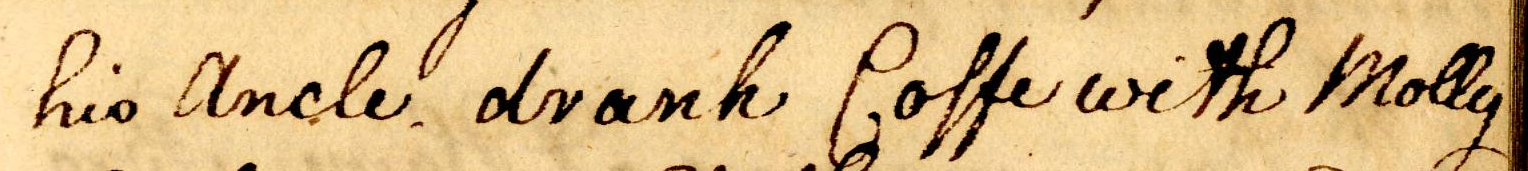his Ancle drank Coffe with Molly
